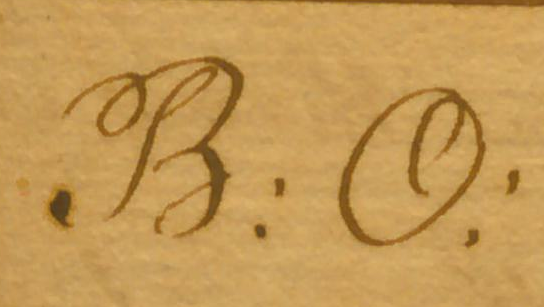B: O:
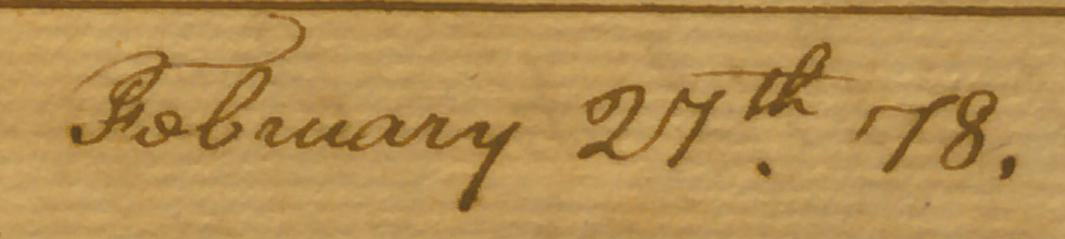February 27^th. 78.
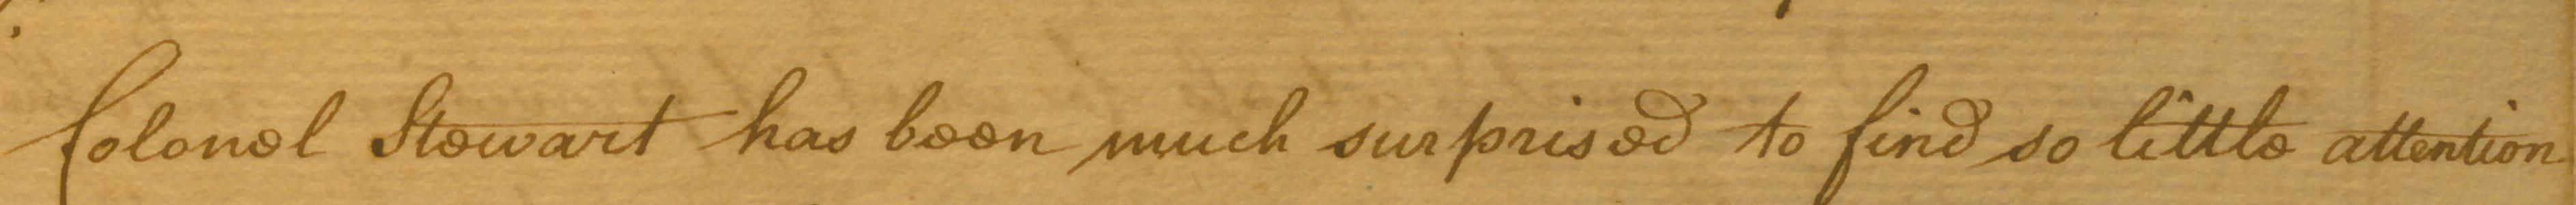Colonel Stewart has bene much surprised to find so little attention
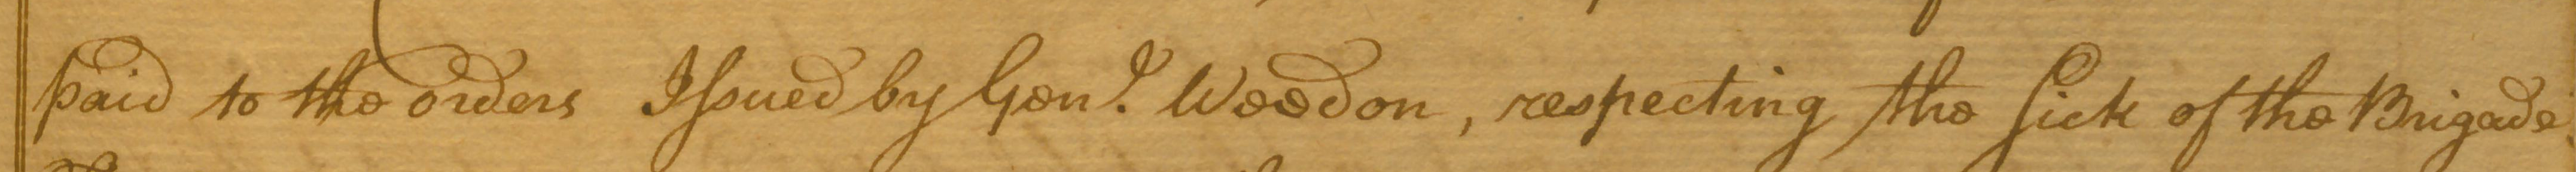paid to the orders Issued by Gen^l. Weedon, respecting the sick of the Brigade
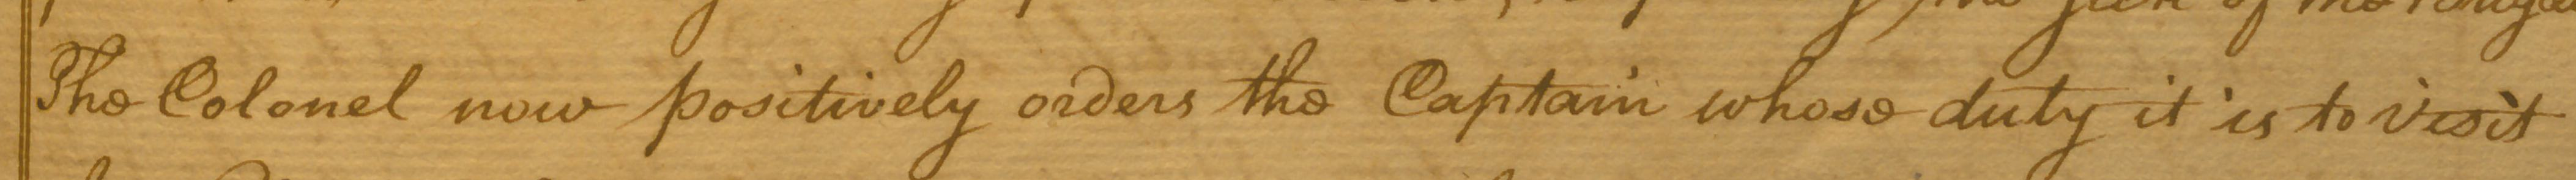The Colonel now positively orders the Captain whose duty it is to visit
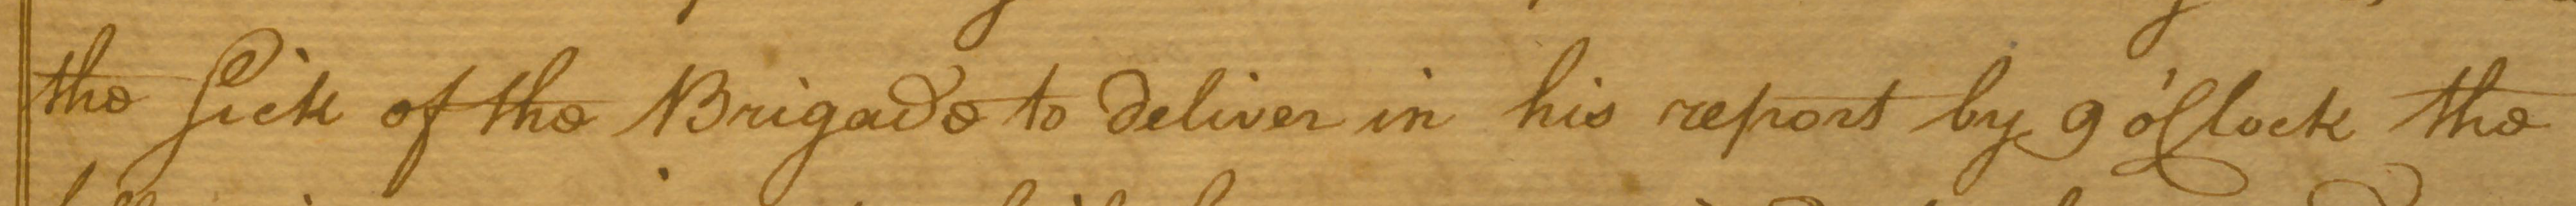the sick of the Brigade to deliver in his report by 9 o'Clock the
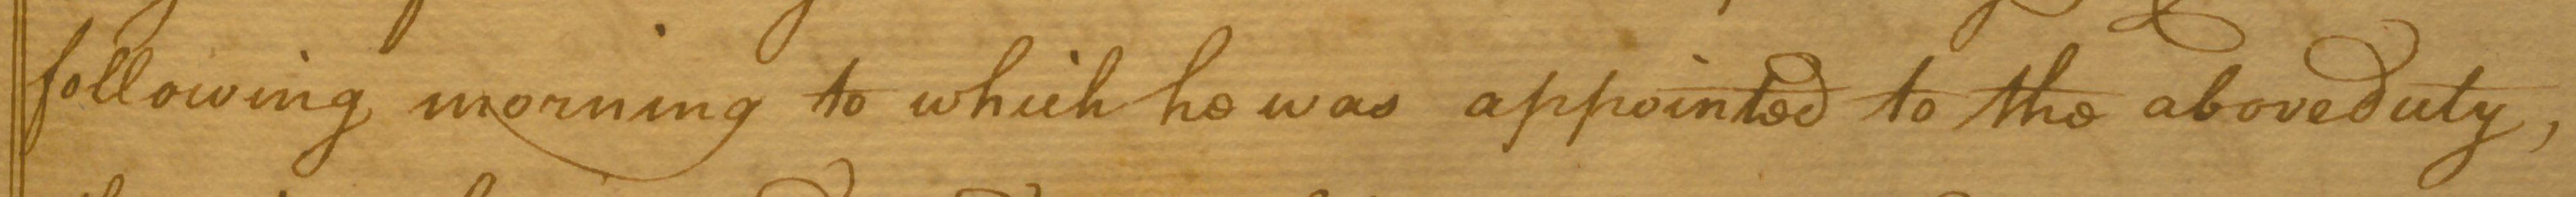following morning to which he was appointed to the above duty,
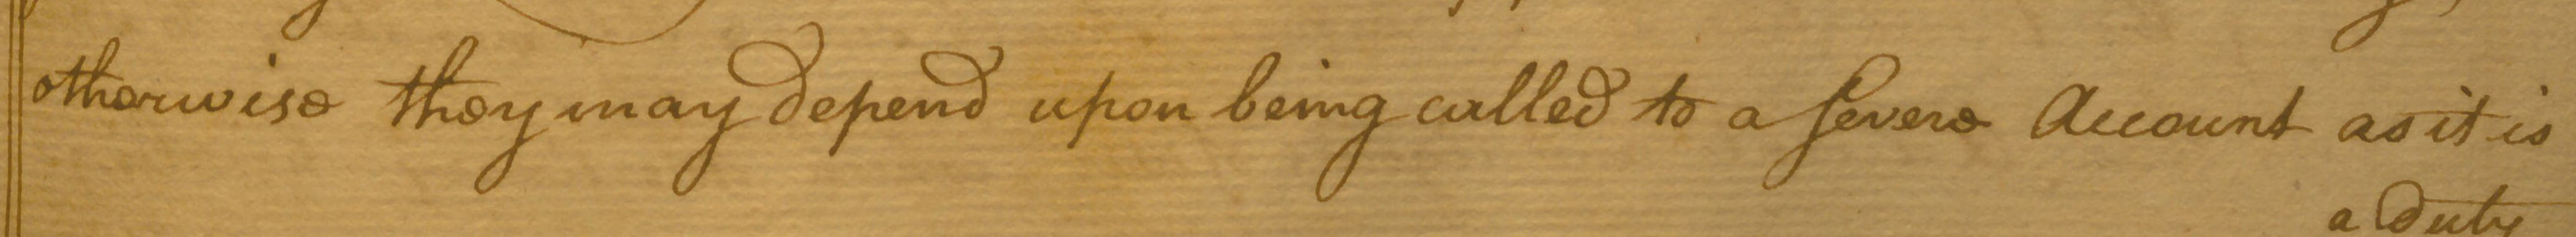otherwise they may depend upon being called to a severe Account as it is
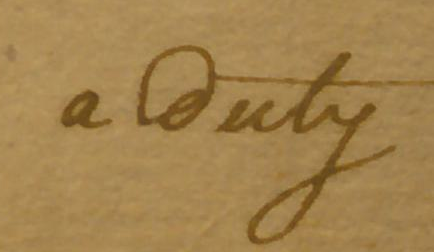a duty
